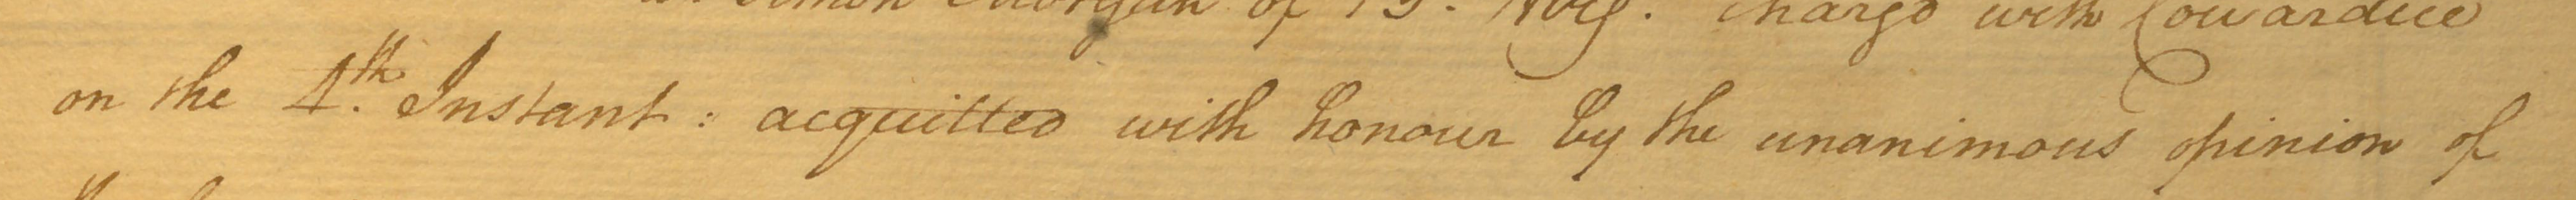on the 4^th. Instant: acquitted with honour by the unanimous opinion of
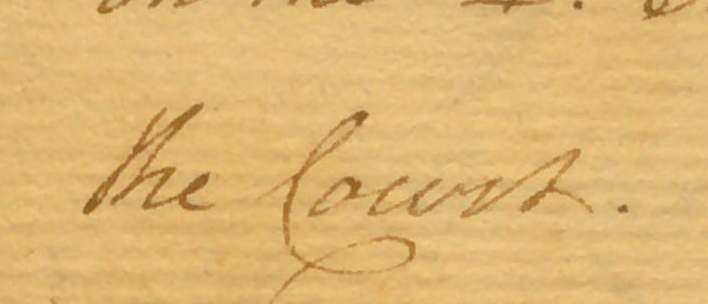the Court.
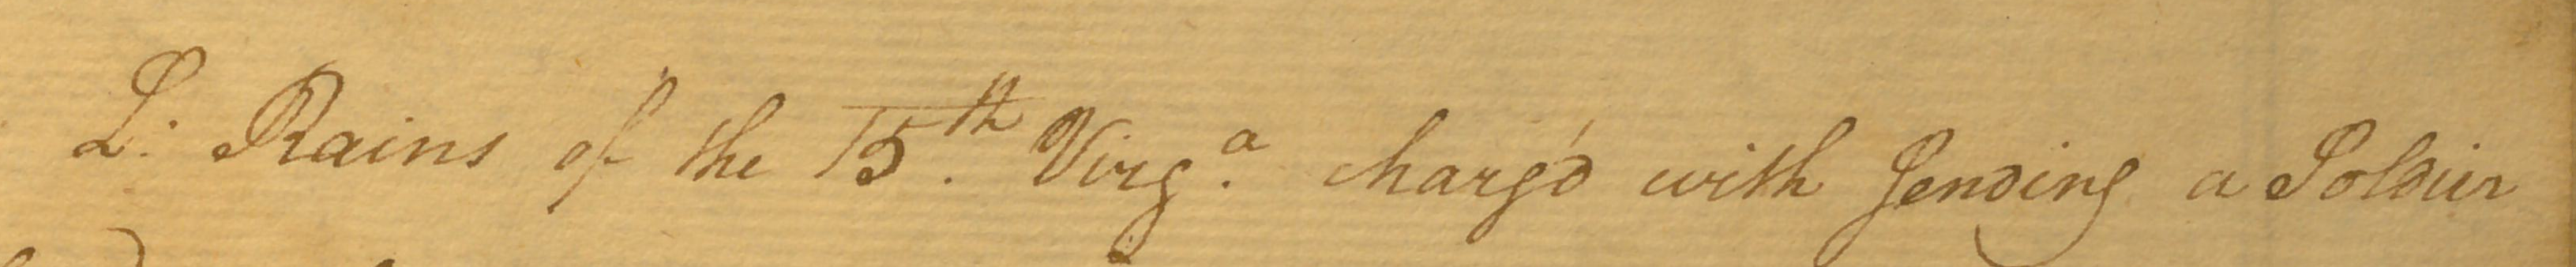L: Raubs of the 15^th. Virg^a. charg'd with sending a Soldier
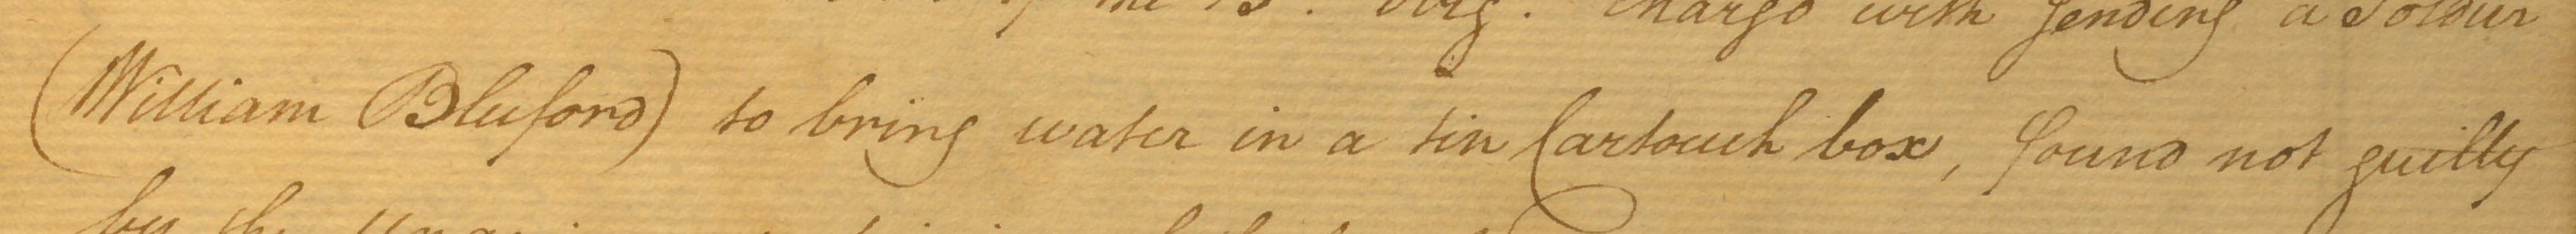(William Bluford) to bring water in a tin Cartouch box, found not guilty
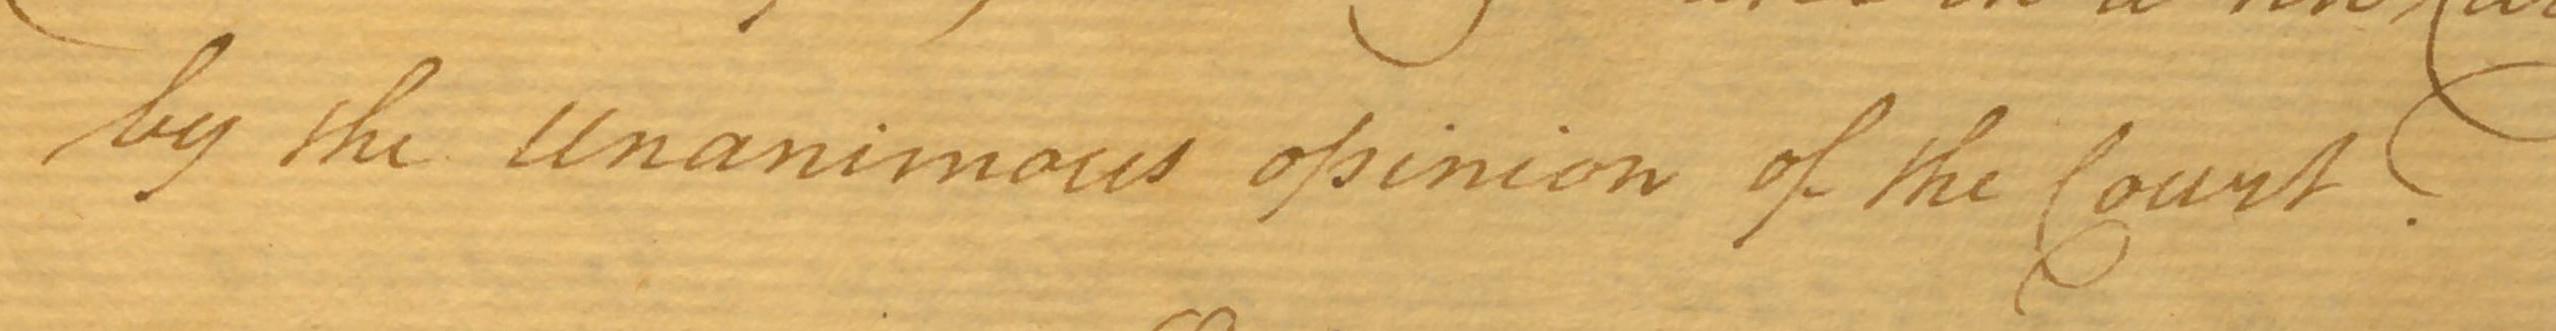by the unanimous opinion of the Court.
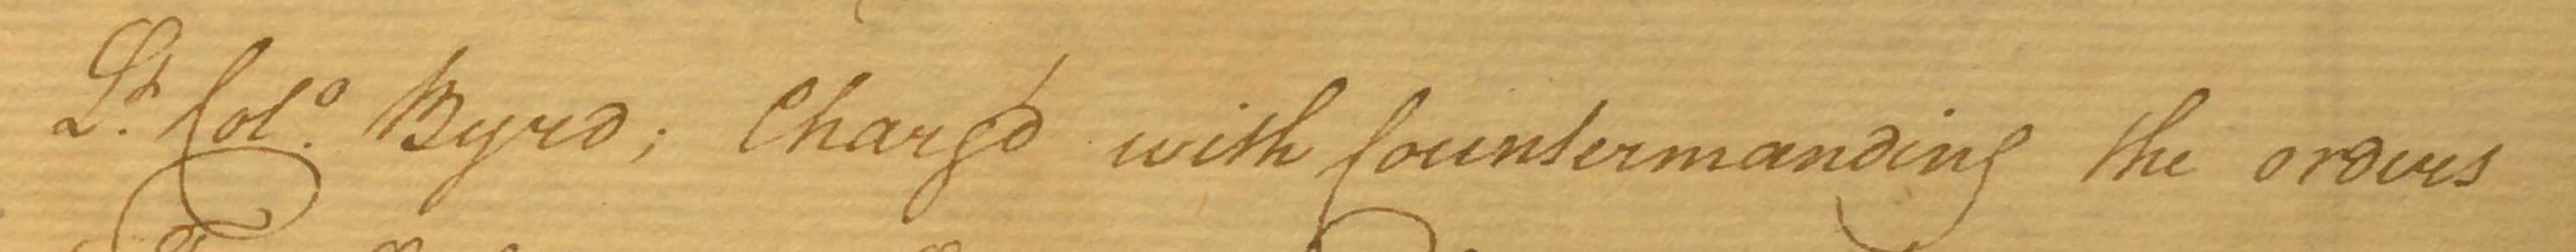L^t. Col^o. Byrd; charg'd with Countermanding the orders
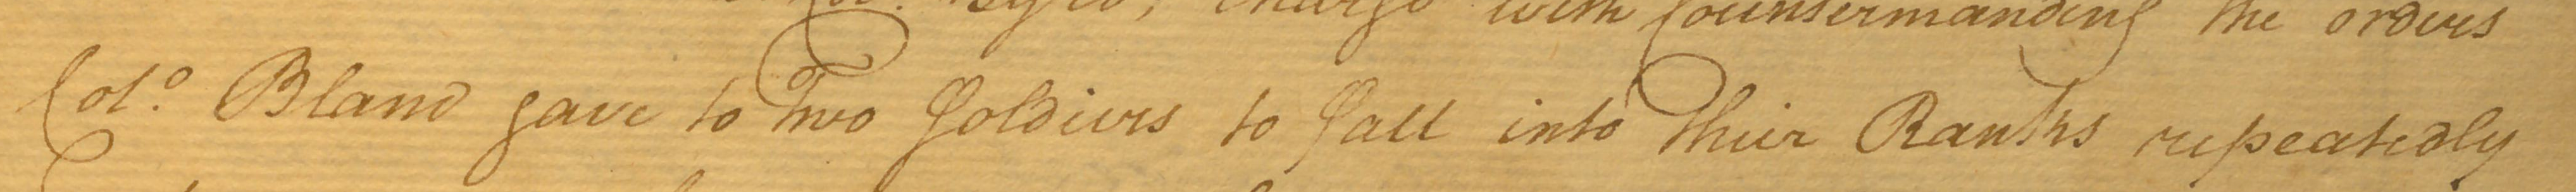Col^o. Bland gave to Two soldiers to fall into their Ranks repeatedly
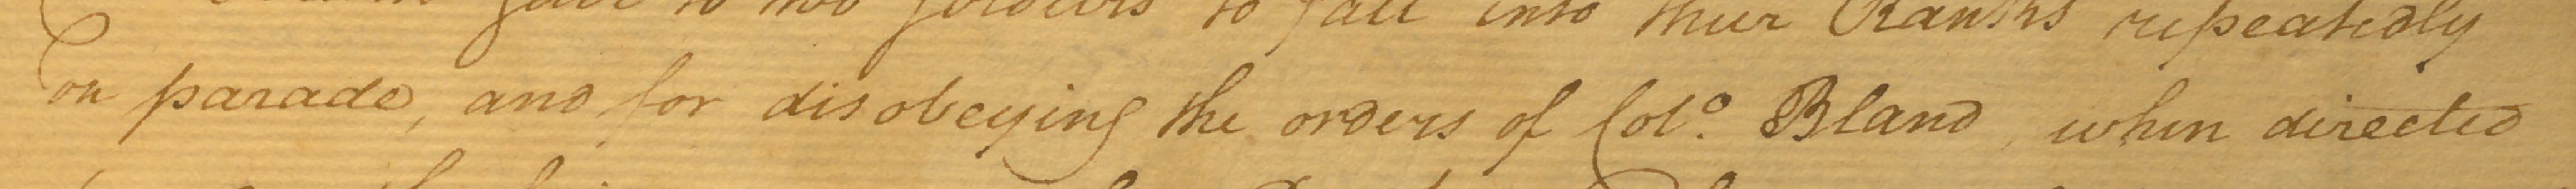on parade, and for disobeying the orders of Col^o. Bland, when directed
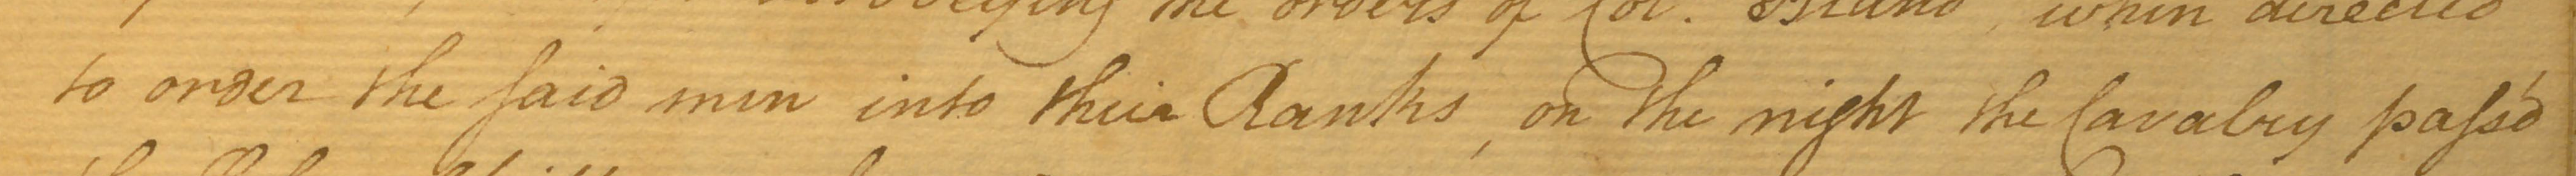to order the said men into their Ranks on the night the Cavalry pass'd
